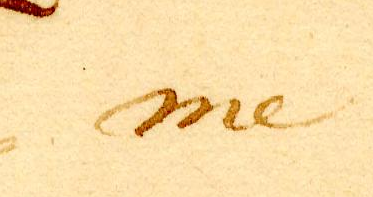me.
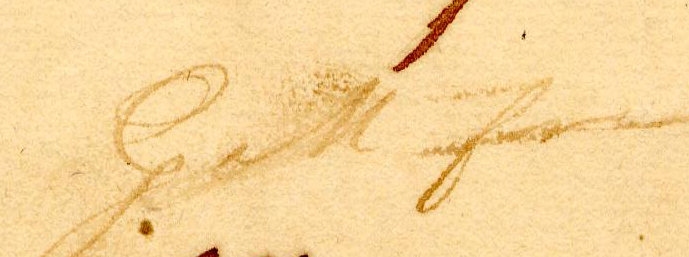G.M. for
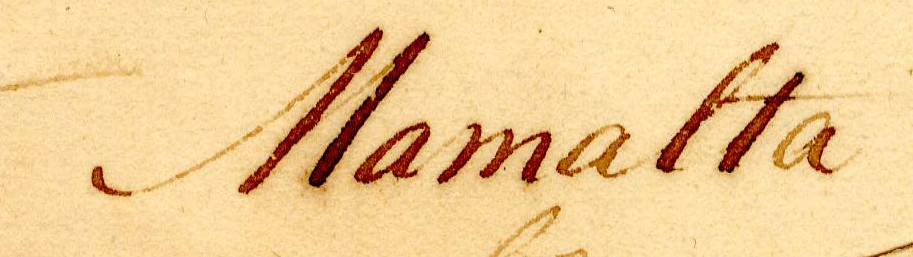Mamalta
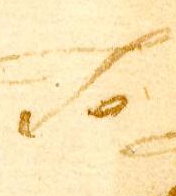To
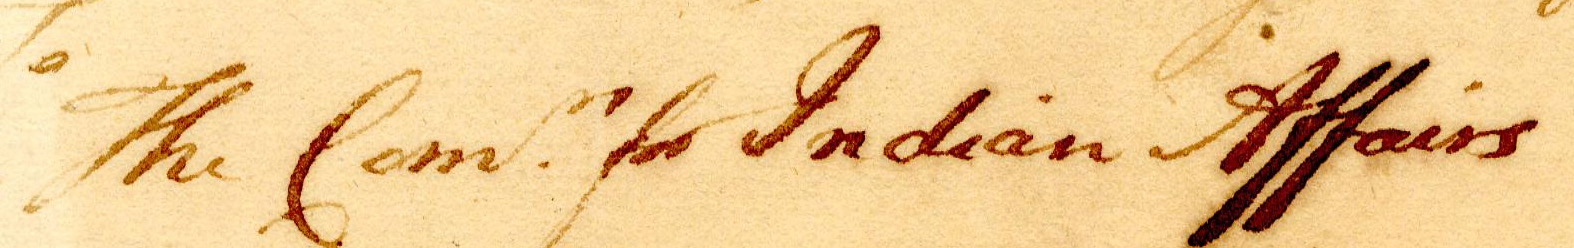The Com^r. for Indian Affairs
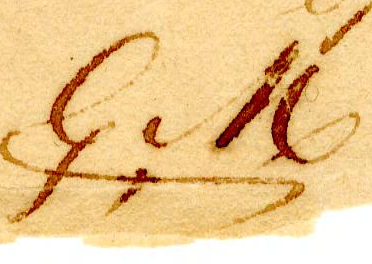G.M.
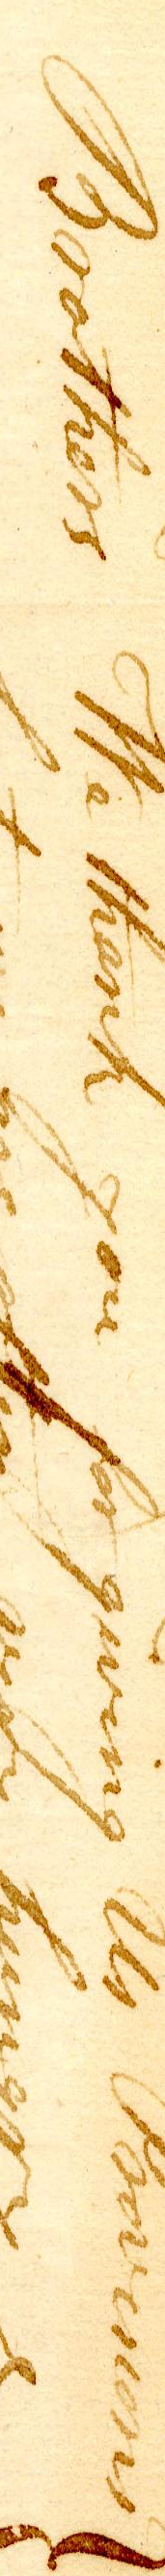Brothers We thank you for giving Us Provisions
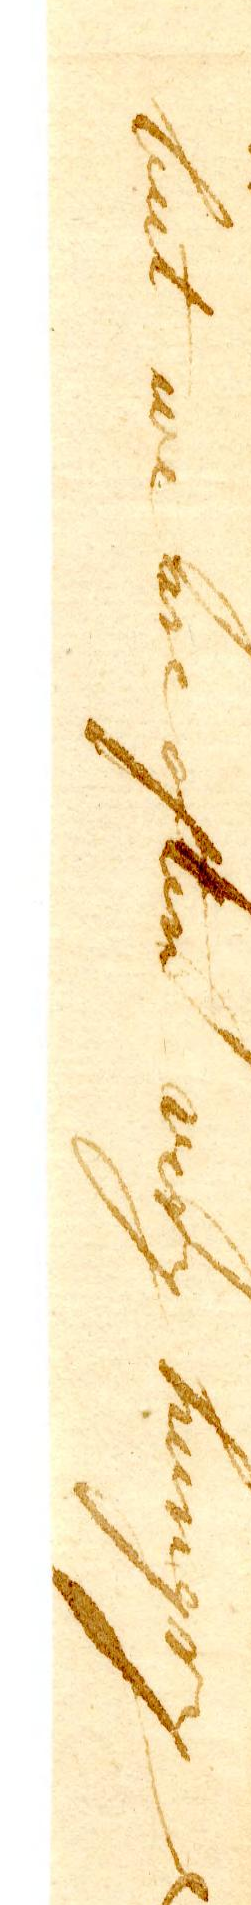but we are often very hungry.
